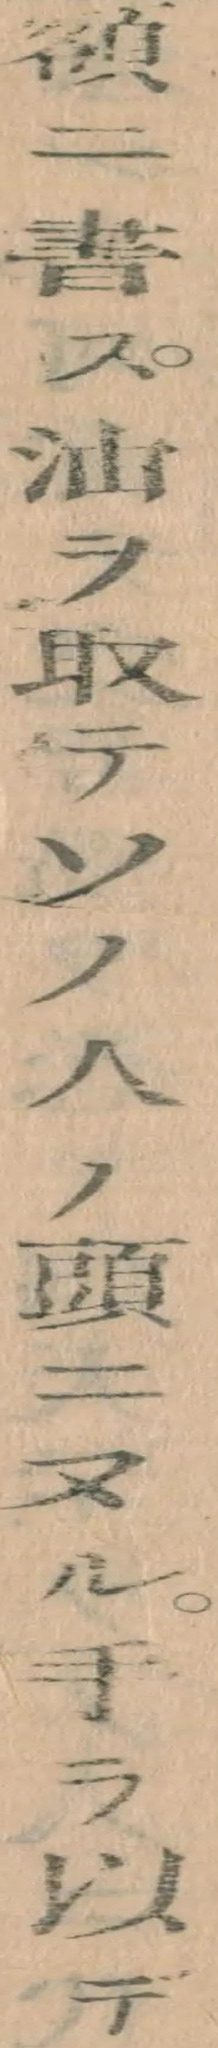額ニ書ス。油ヲ取テソノ人ノ頭ニヌル。手ヲ以テ
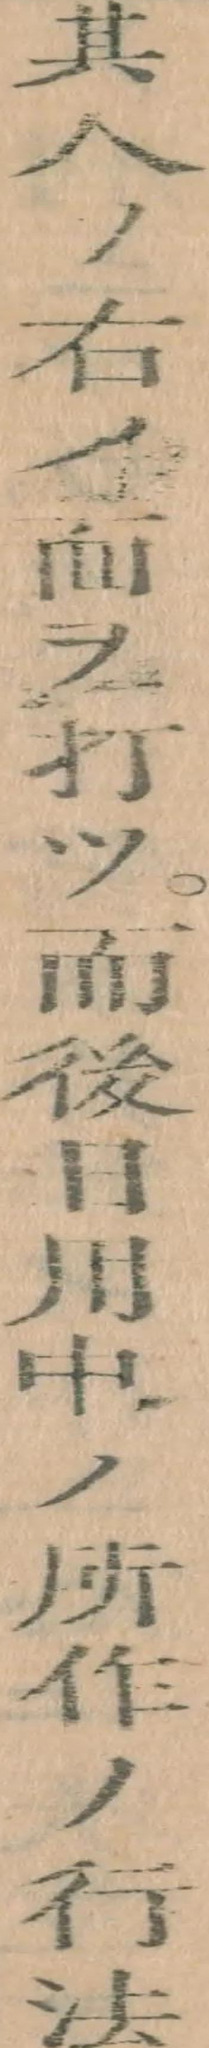其人ノ右ノ面ヲ打ツ。而後日用中ノ所作ノ行法
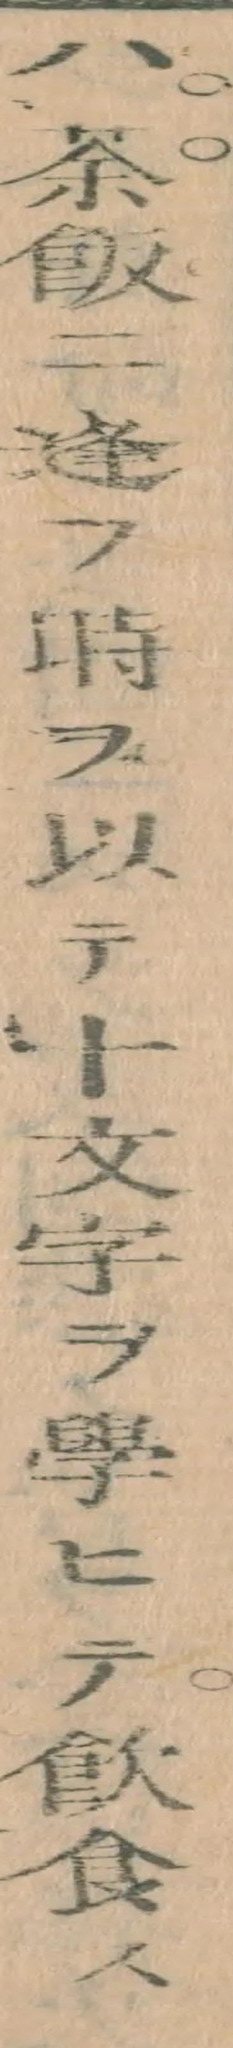ハ。茶。飯。ニ逢フ時ヲ以テ十文字ヲ学ヒテ。飲食ス
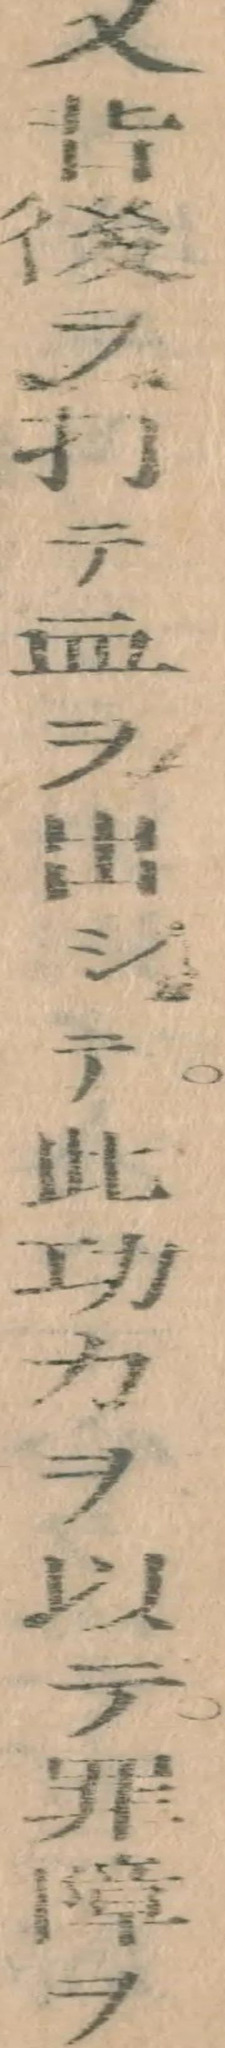又背後ヲ打テ血ヲ出シテ。此功力ヲ以テ。罪障ヲ
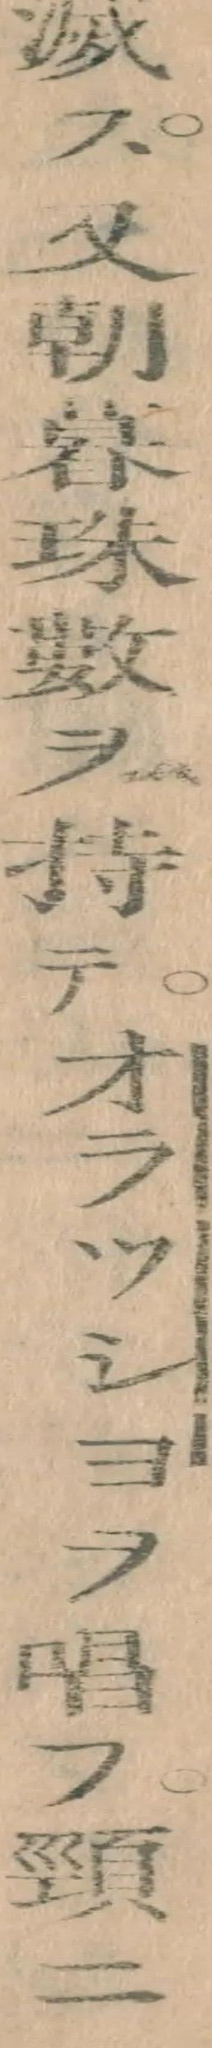滅ス。又朝暮珠数ヲ持テ。オラツシヨヲ唱フ。頸ニ
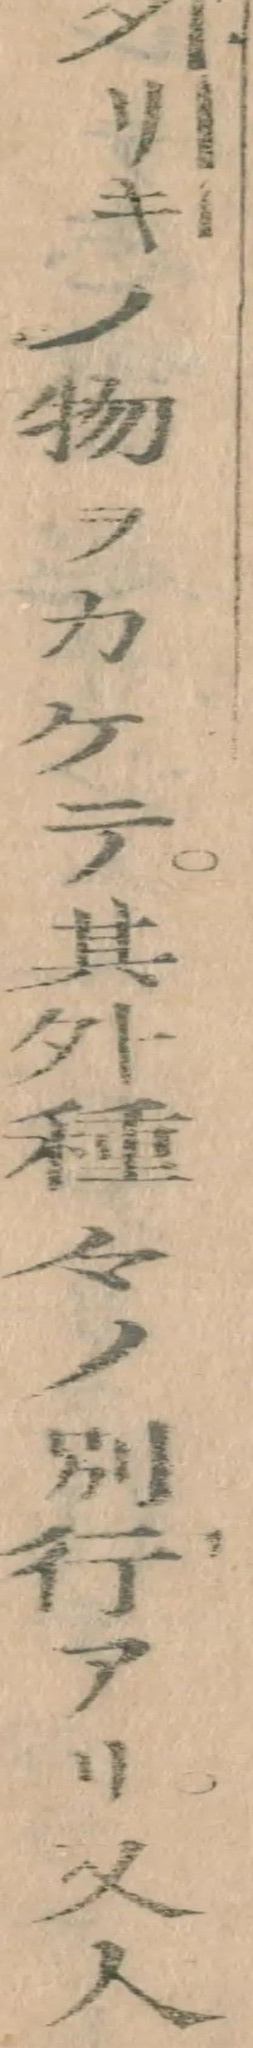タリキノ物ヲカケテ。其外種々ノ別行アリ。又人
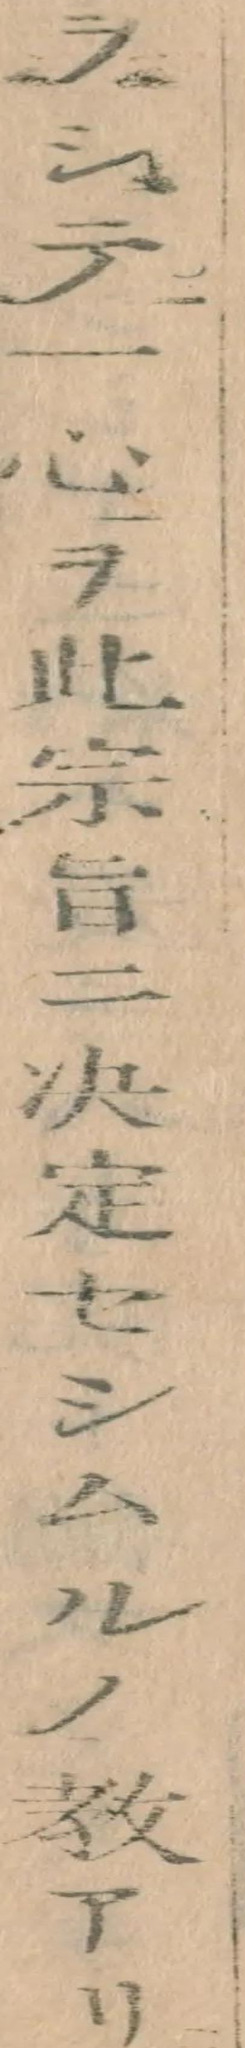ヲシテ。一心ヲ此宗旨ニ決定セシムルノ教アリ
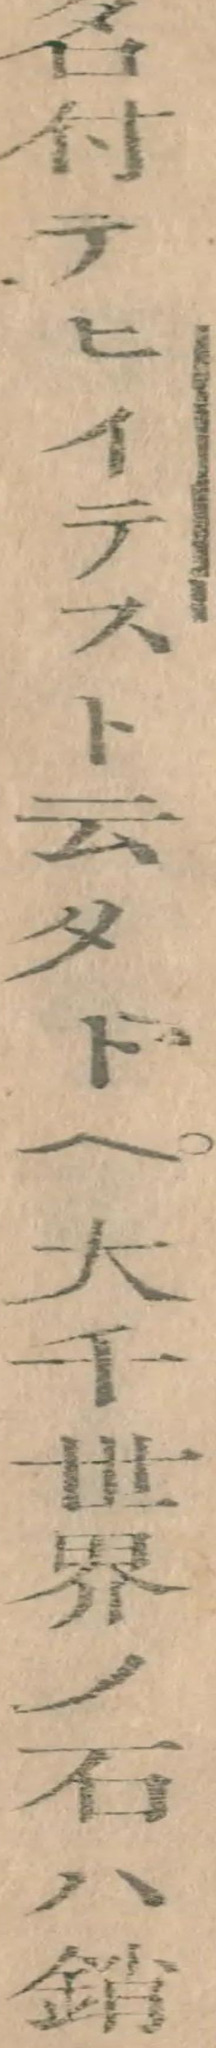名付テヒイテスト云タトヘ。大千世界ノ石ハ銷
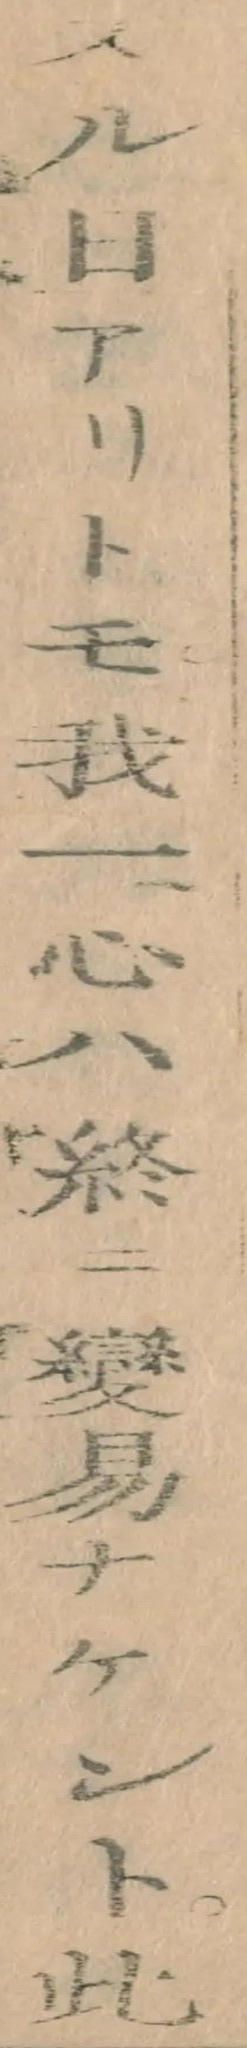スル日アリトモ我一心ハ終ニ変易ナケント。此

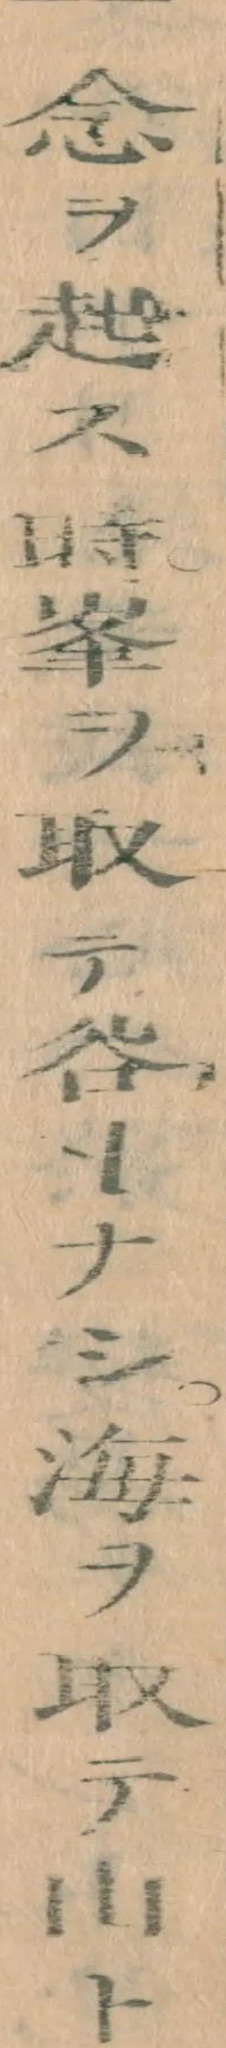一念ヲ起ス時。峰ヲ取テ谷トナシ。海ヲ取テ山ト
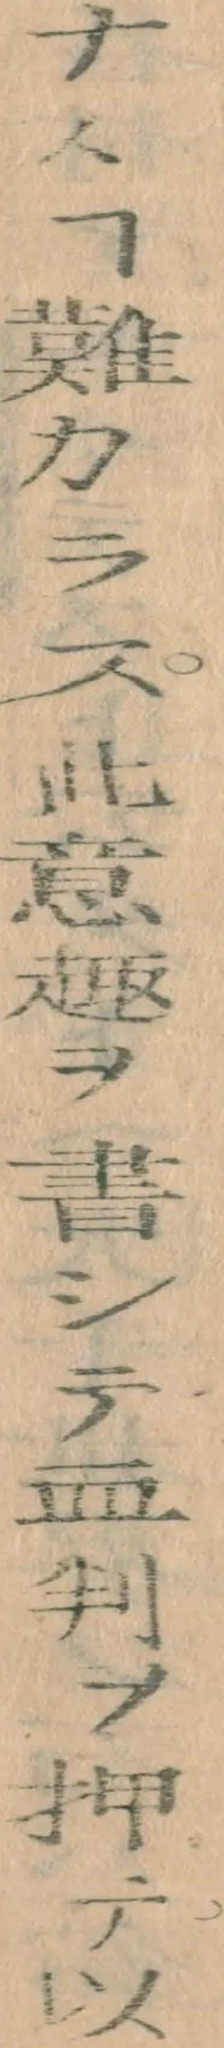ナスヿ難カラス。此意趣ヲ書シテ。血判ヲ押テ。以
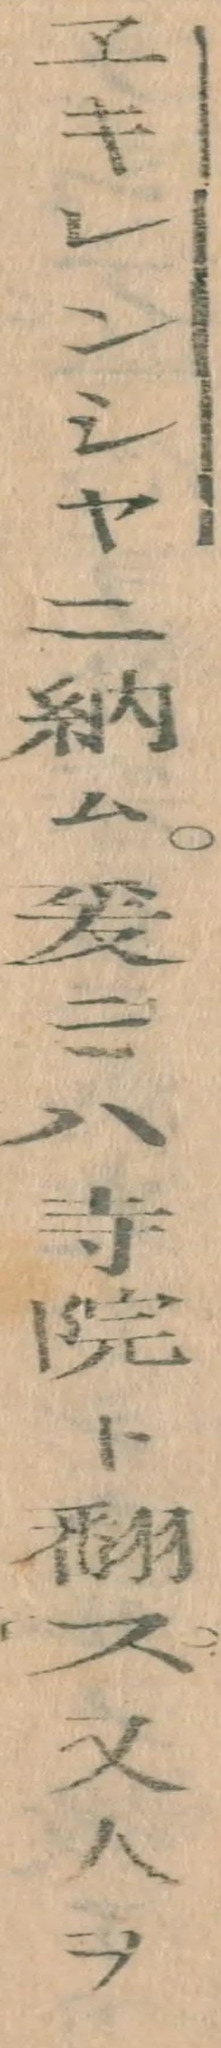ヱキレンシヤニ納ム。爰ニハ寺院ト翻ス。又人ヲ
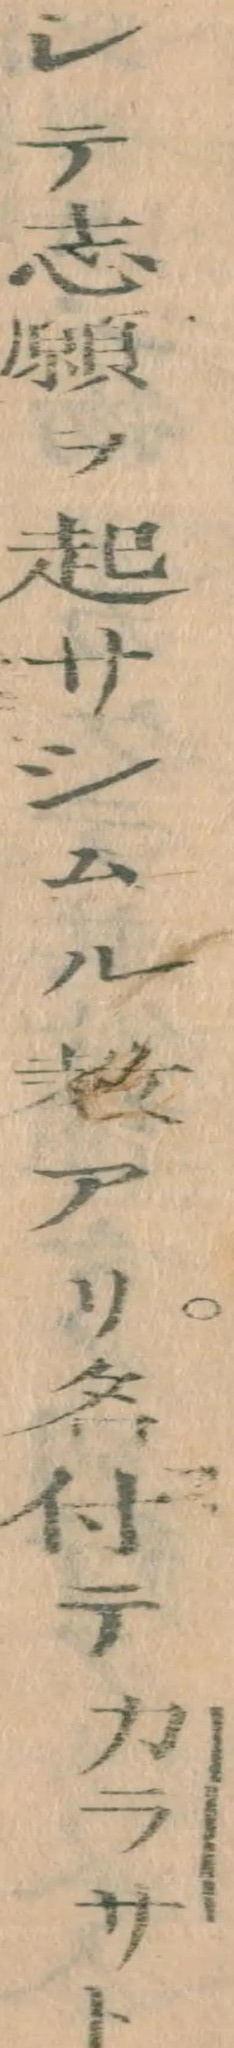シテ志願ヲ起サシムル教アリ。名付テカラサト
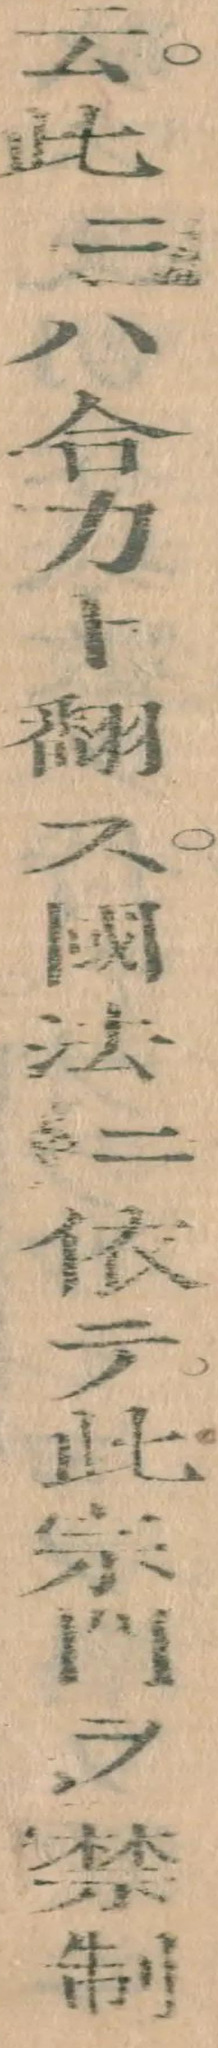云。此ニハ合力ト翻ス。国法ニ依テ。此宗門ヲ禁制
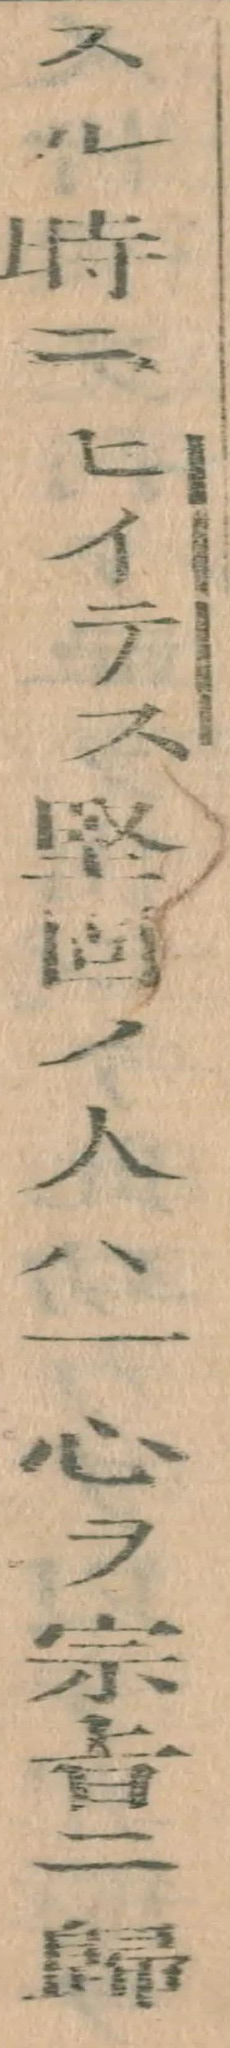スル時ニヒイテス堅固ノ人ハ一心ヲ宗旨ニ帰
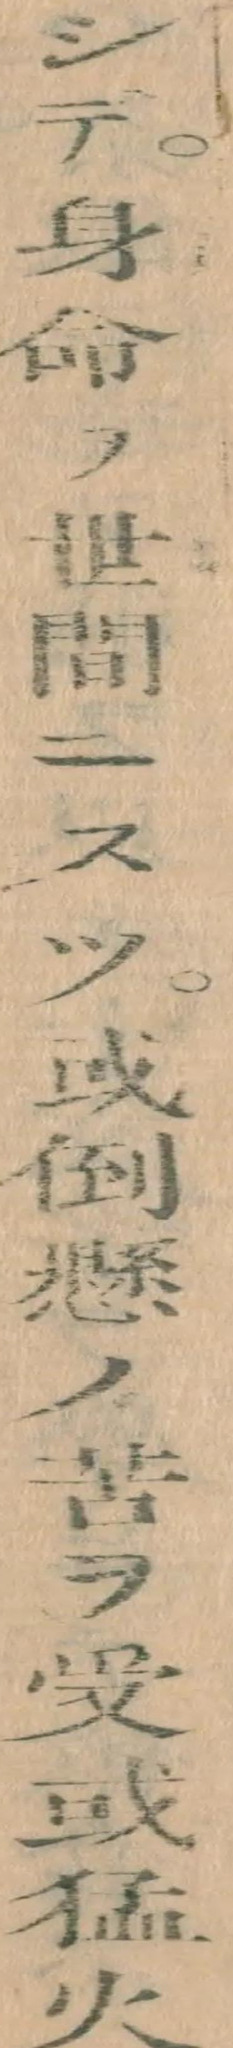シテ。身命ヲ世間ニスツ。或倒懸ノ苦ヲ受或もうか猛火
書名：南蛮寺興廃記
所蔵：国立国会図書館 National Diet Library, JAPAN
